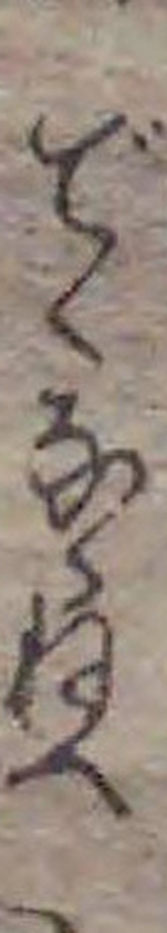でゝならねへ
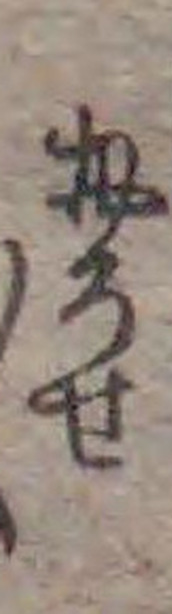おろせ
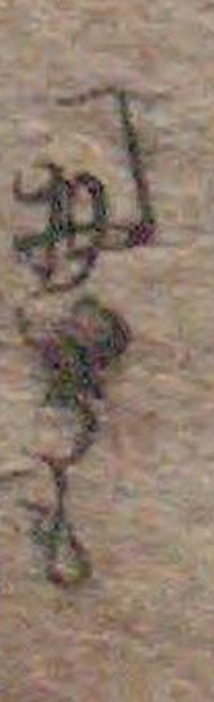〽おいらも

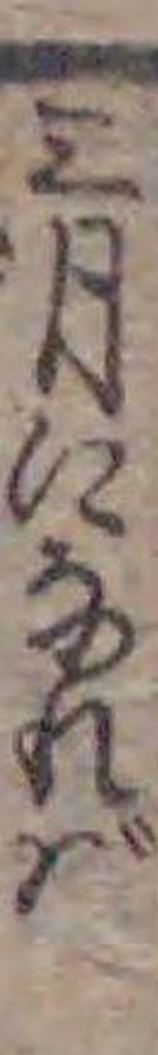三月になれば
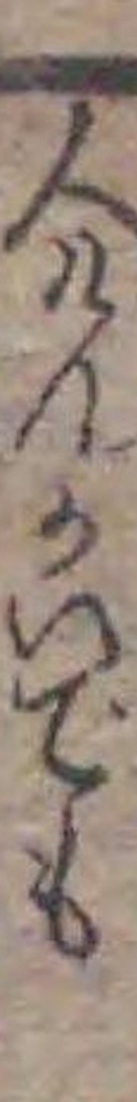人げんかいでも
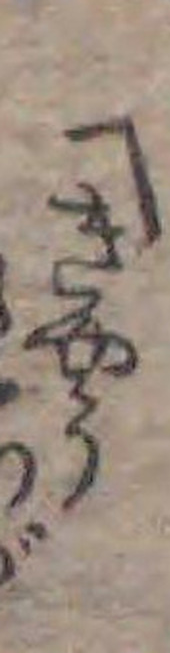〽きやう
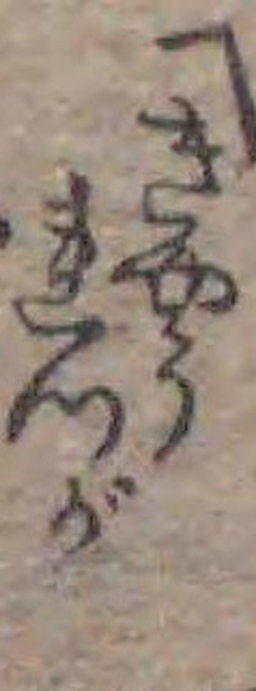れつが
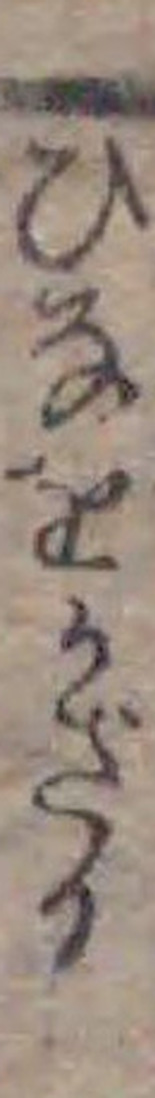はなをかざる
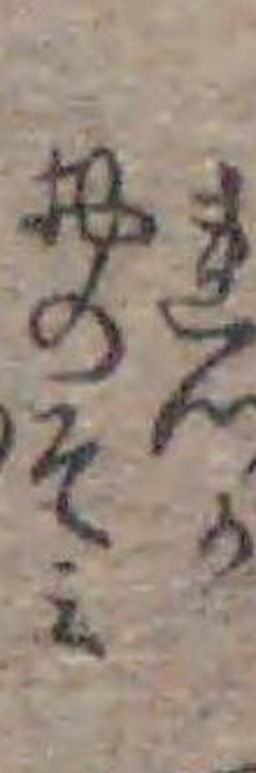おのそみ
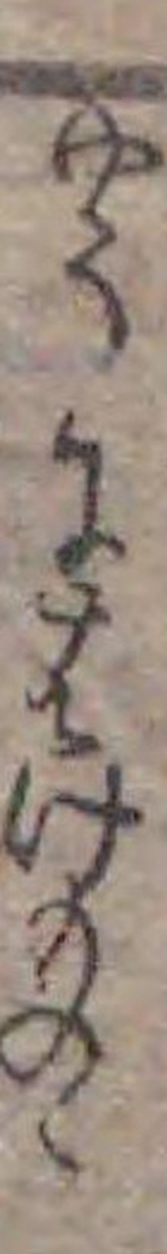やうにはけものゝ
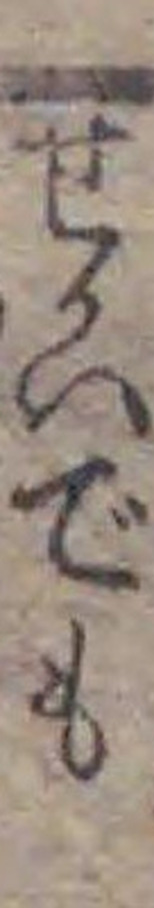せかいでも
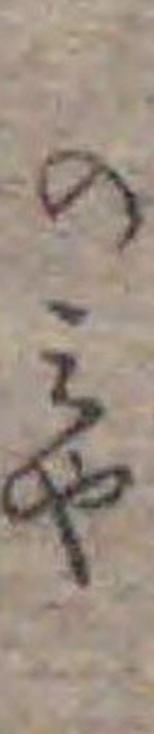のみや
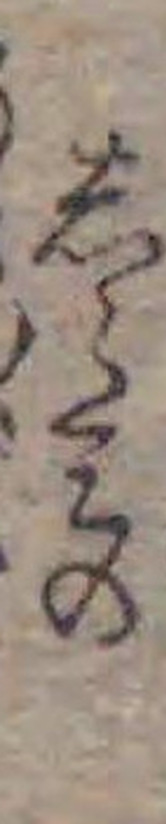しらみの
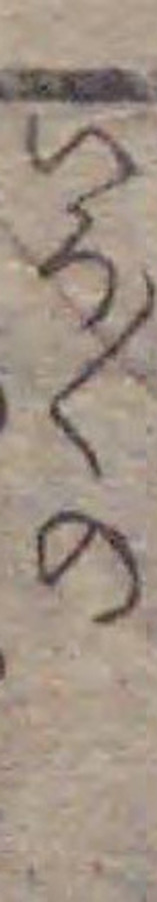いろ〳〵の
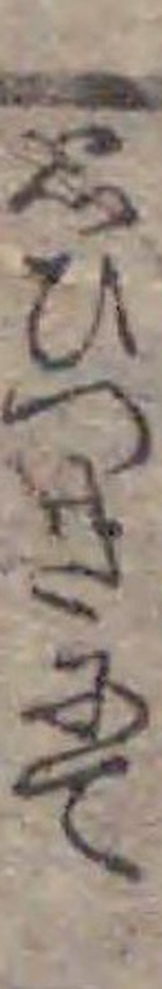思ひつきにて
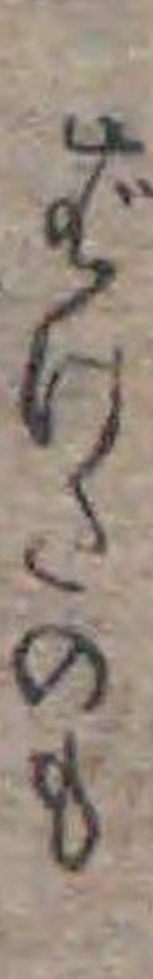ばけたのも
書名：年中行状記 : 2巻
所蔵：国立国会図書館 National Diet Library, JAPAN
